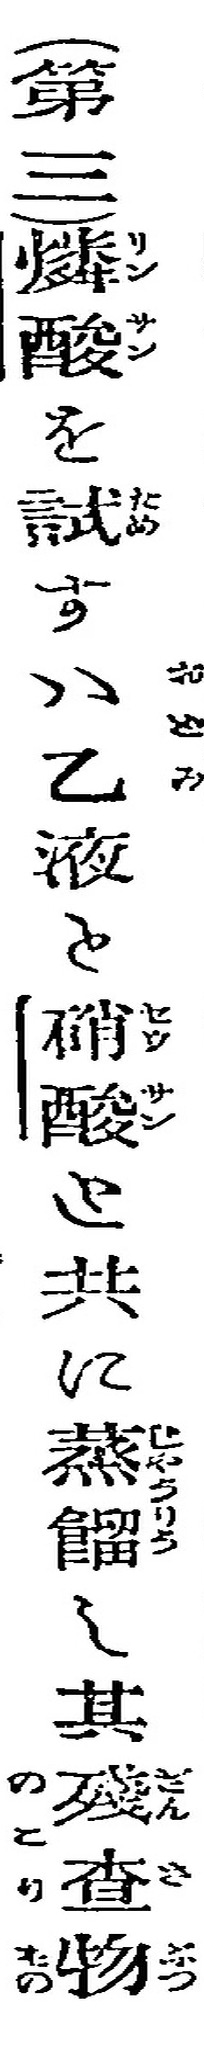[第三]燐酸を試すは乙液と硝酸と共に蒸餾し其残査物
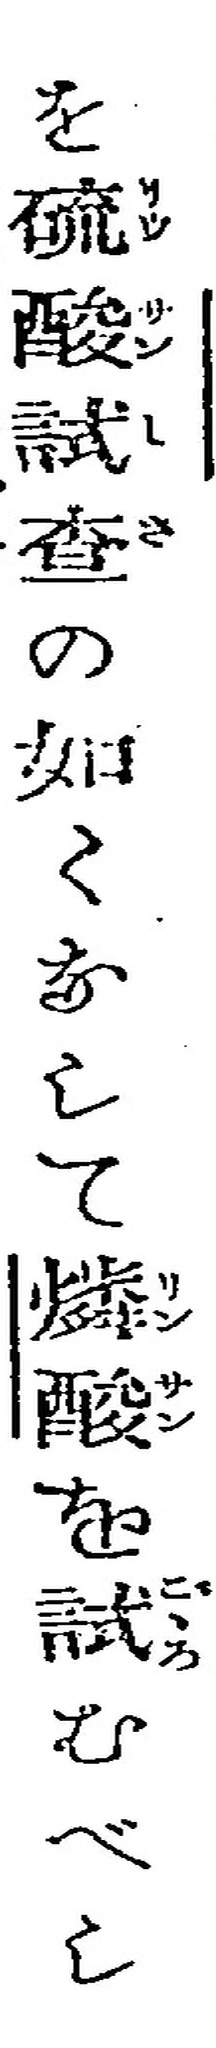を硫酸試査の如くなして燐酸を試むべし
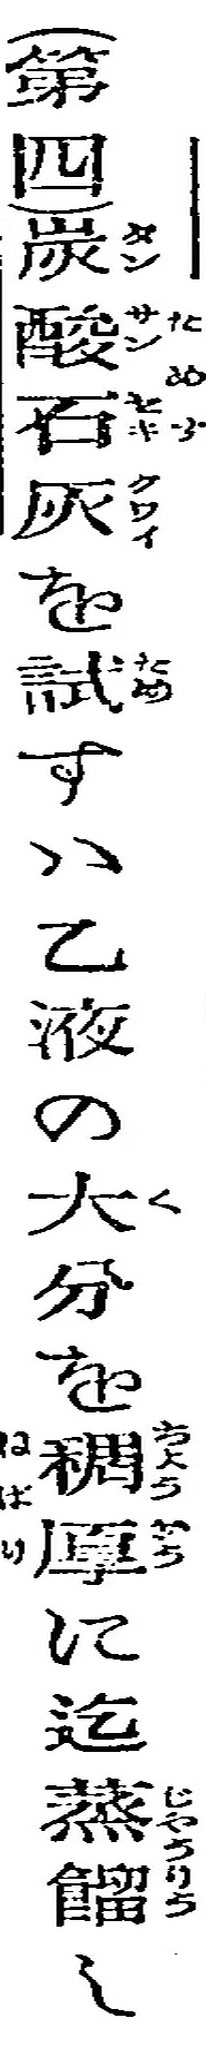[第四]炭酸石灰を試すは乙液の大分を稠厚に迄蒸餾し
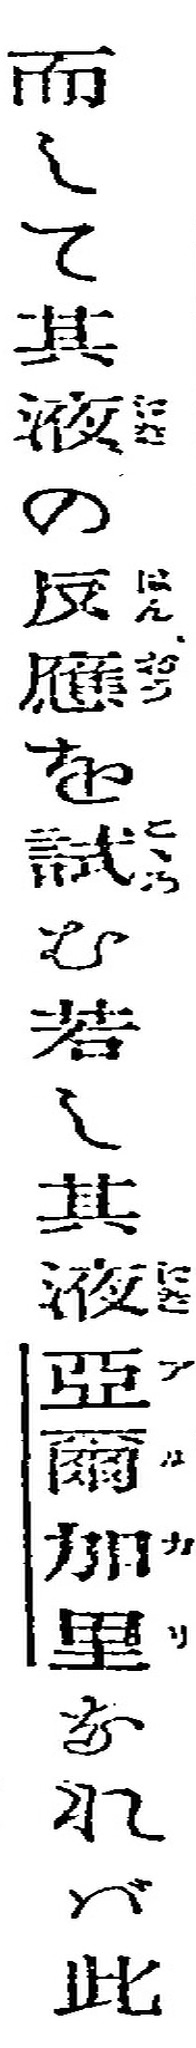而して其液の反應を試む若し其液亞磁加里なれば此
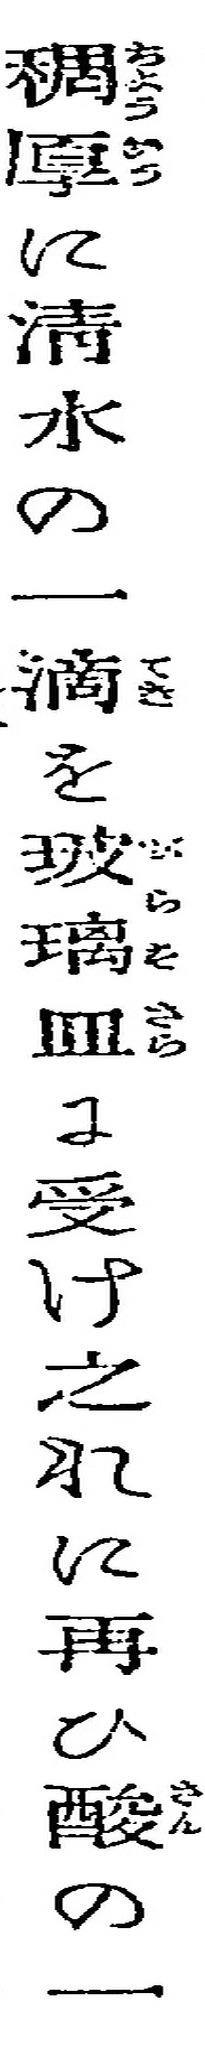稠厚に清水の一滴を玻璃皿に受け之れに再ひ酸の一
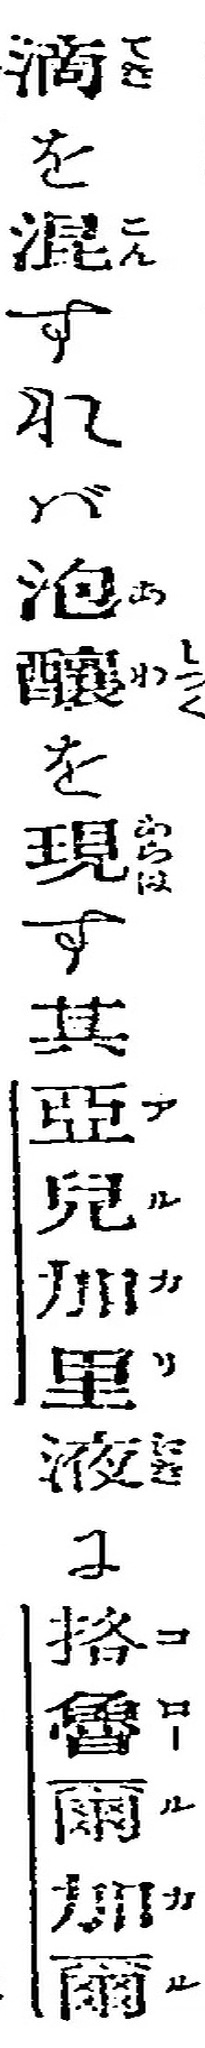滴を混すれば泡醸を現す其亞兒加里液に挌魯爾加爾
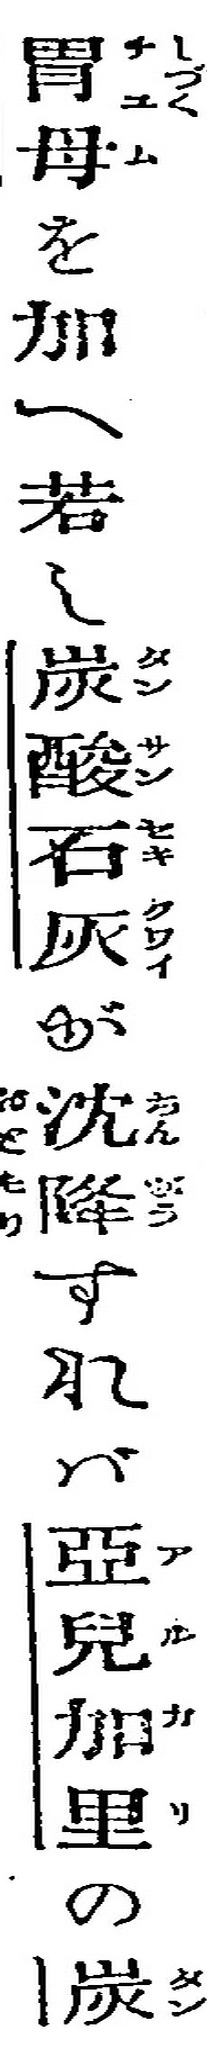胃を加へ若し炭酸石灰が沈降すれば亞兒加里の炭

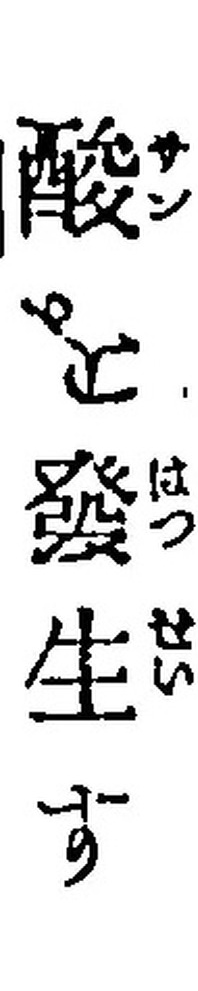酸を発生す
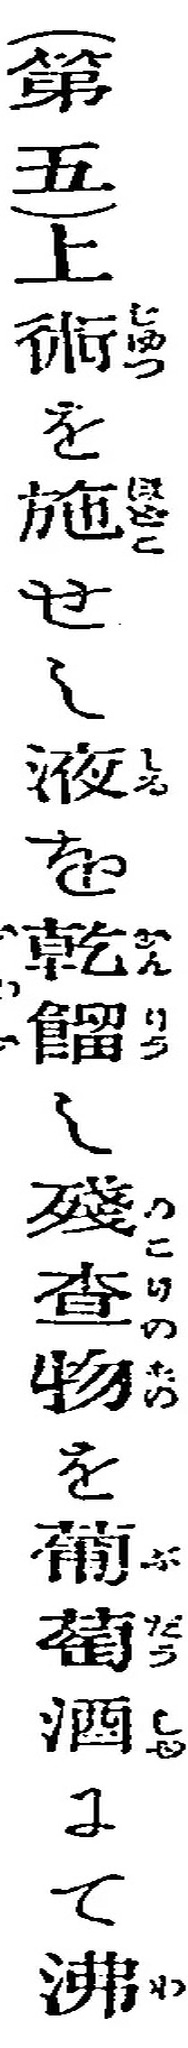[第五]上術を施せし液を乾餾し残査物を葡萄酒にて沸
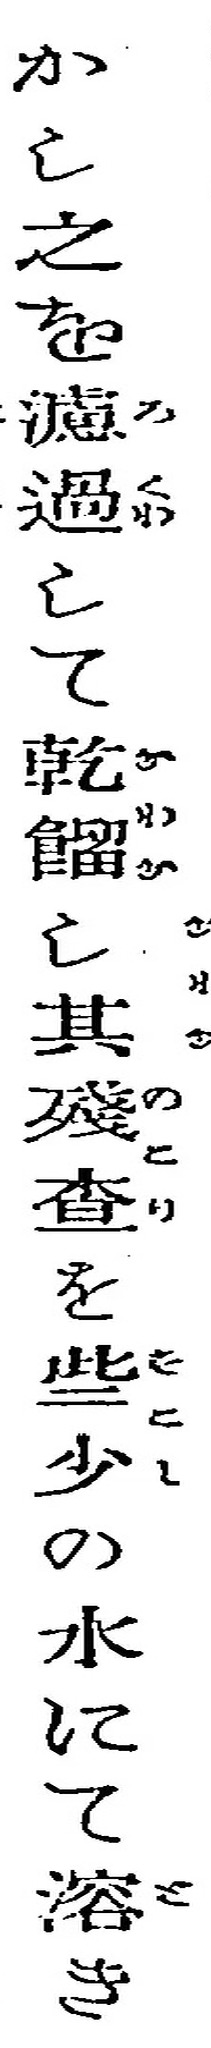かし之を濾過して乾餾し其残査を些少の水にて溶き
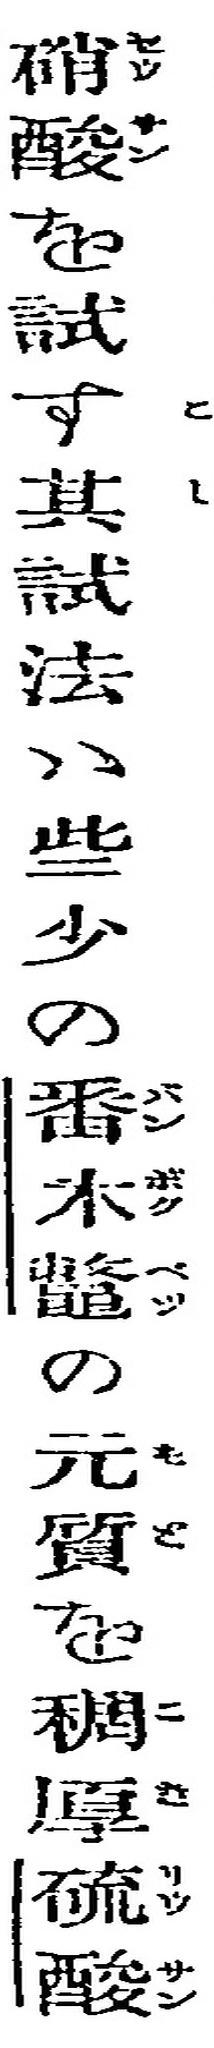硝酸を試す其試法は些少の番木鼈の元質を稠厚硫酸
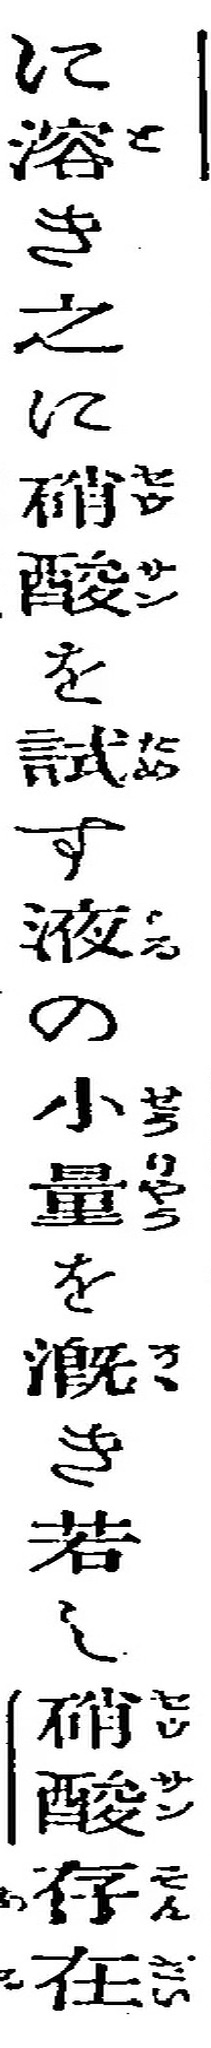に溶き之に硝酸を試す液の小量を漑き若し硝酸存在
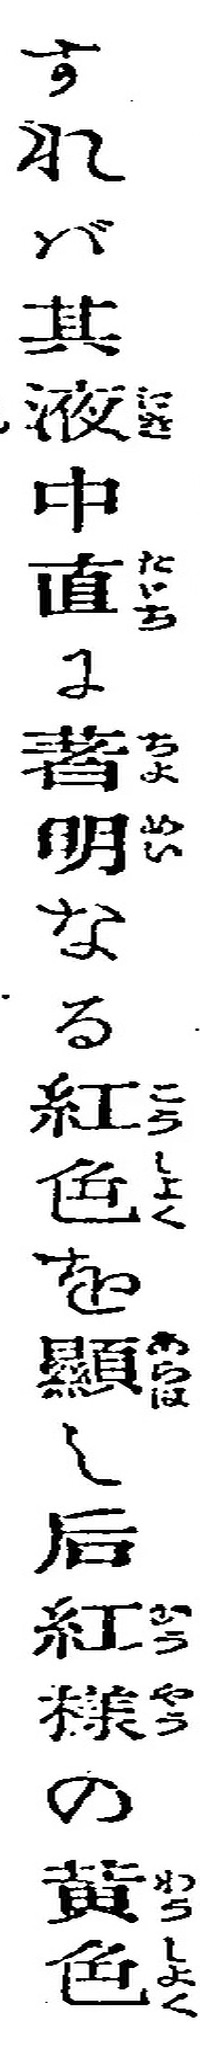すれば其液中直に著名なる紅色を顕し后紅様の黄色
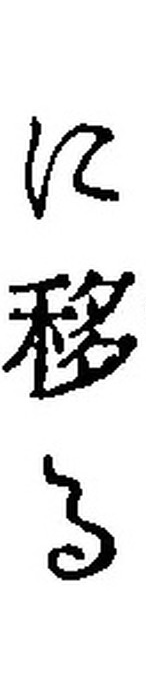に移る
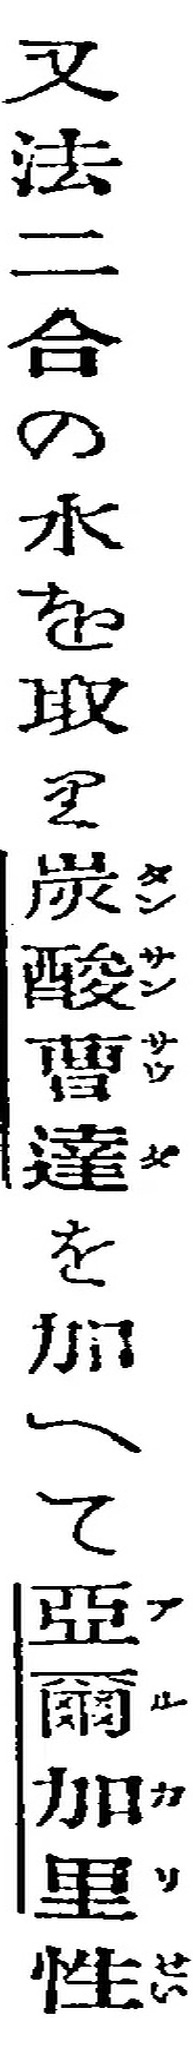又法二合の水を取り炭酸曹達を加へて亞爾加里性
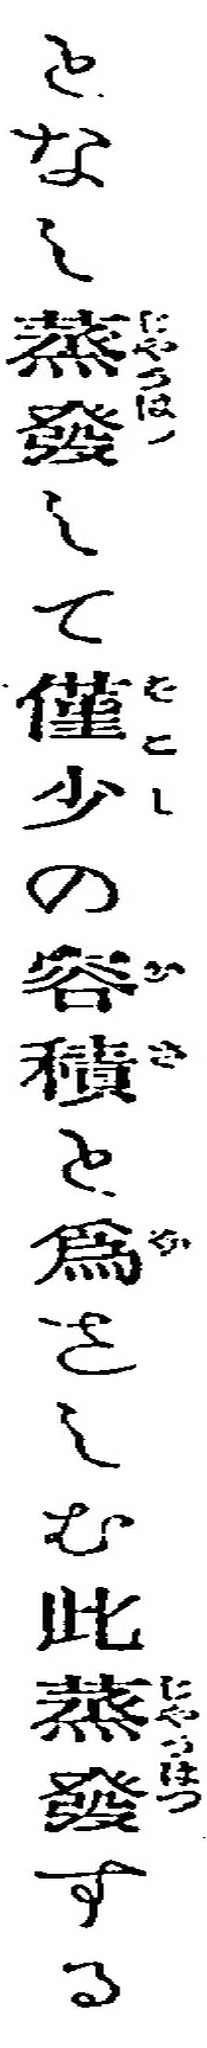となし蒸発して僅少の容積と為さしむ此蒸発する
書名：飲水の心得 : 伝染病の予防
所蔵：国立国会図書館 National Diet Library, JAPAN
